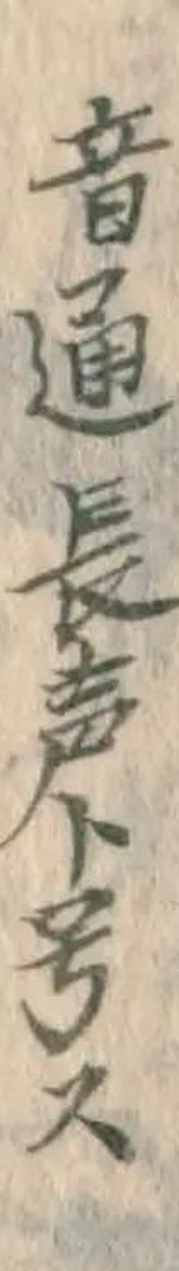音通長声ト号ス
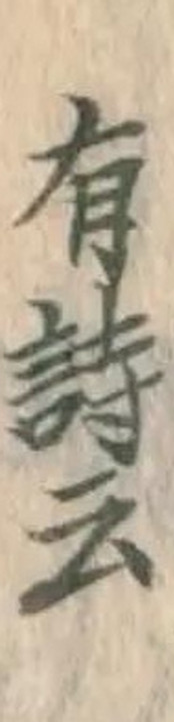有詩云
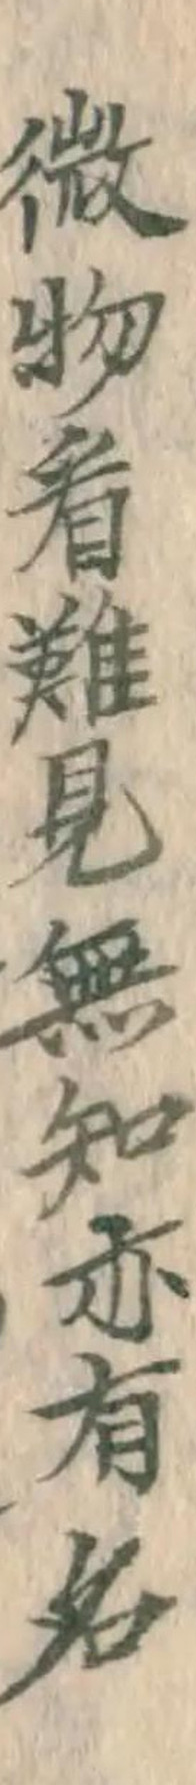微物看難見無知亦有名
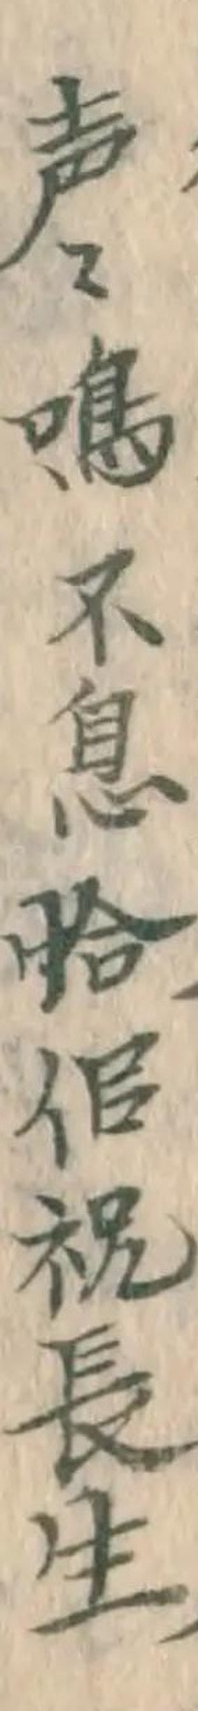声々鳴不息恰佀祝長生

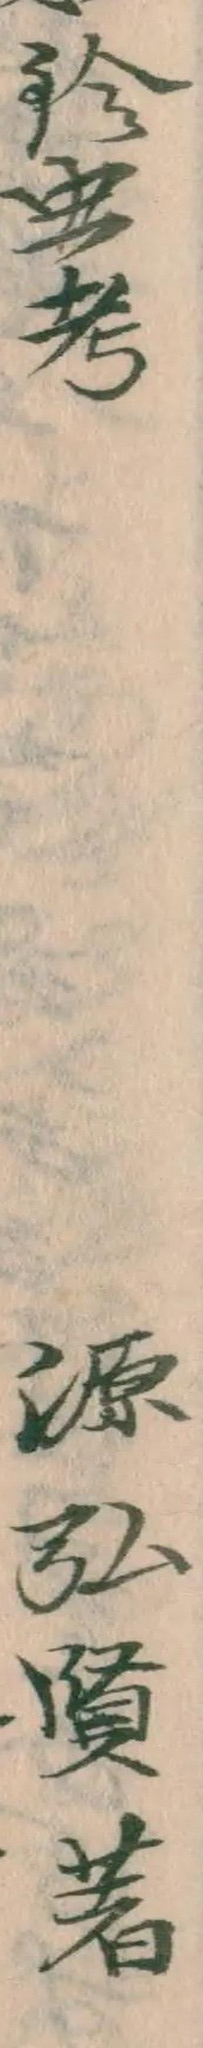松鈴虫考源弘賢著
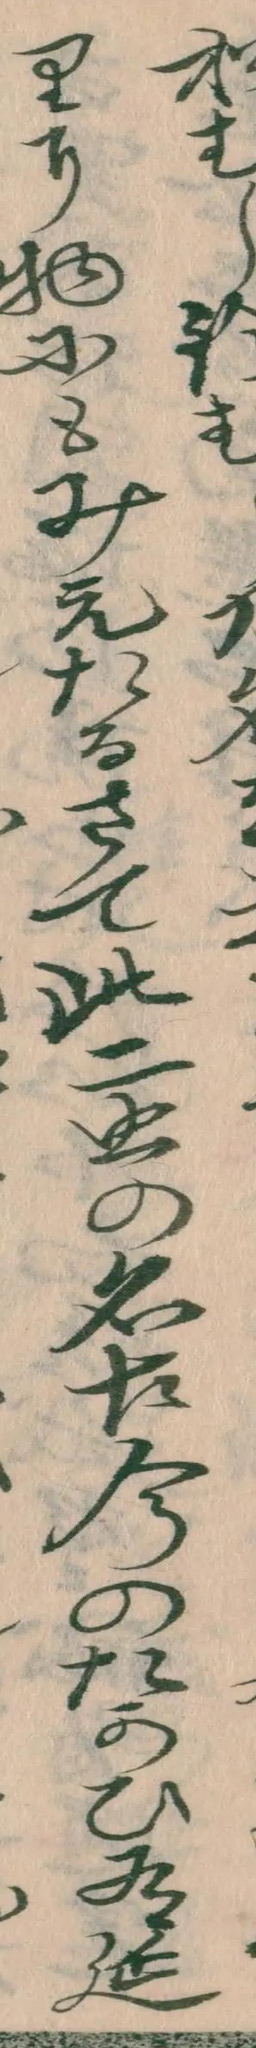りに物にもみえたるさて此二虫の名古今のたかひ有延
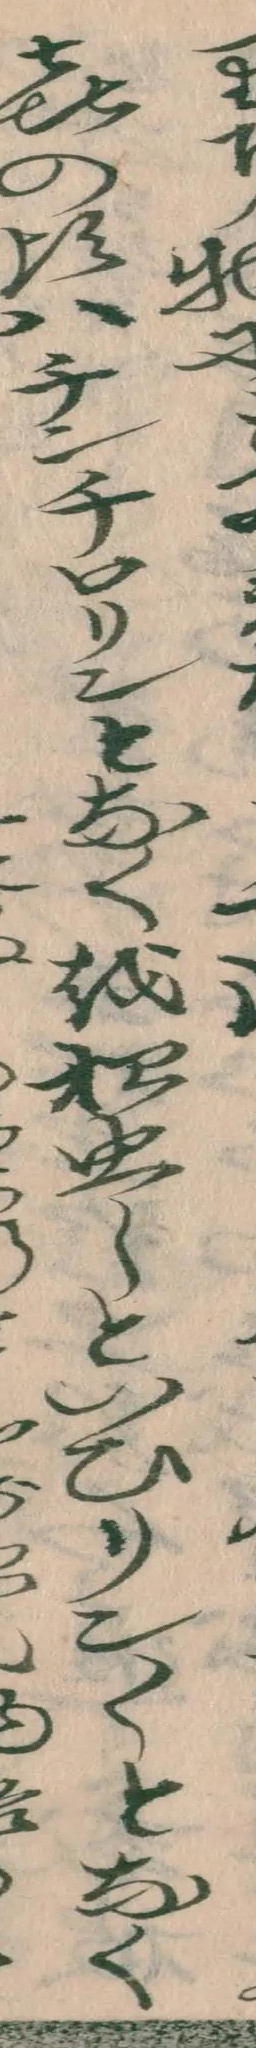㐂の頃はチンチロリンとなくを松虫しといひリン〱となく
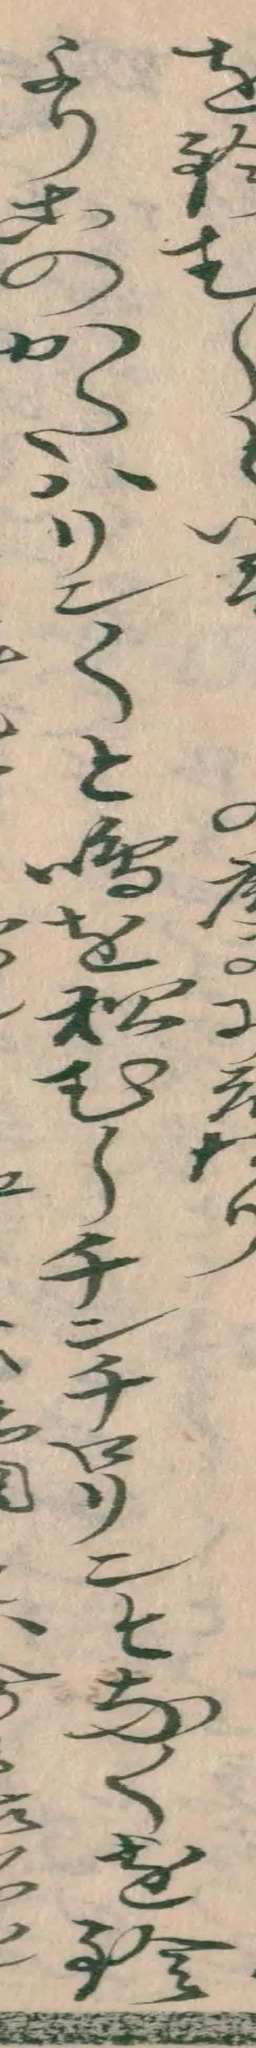よりこのかたはリン〱と鳴を松むしチンチロリンとなくを鈴
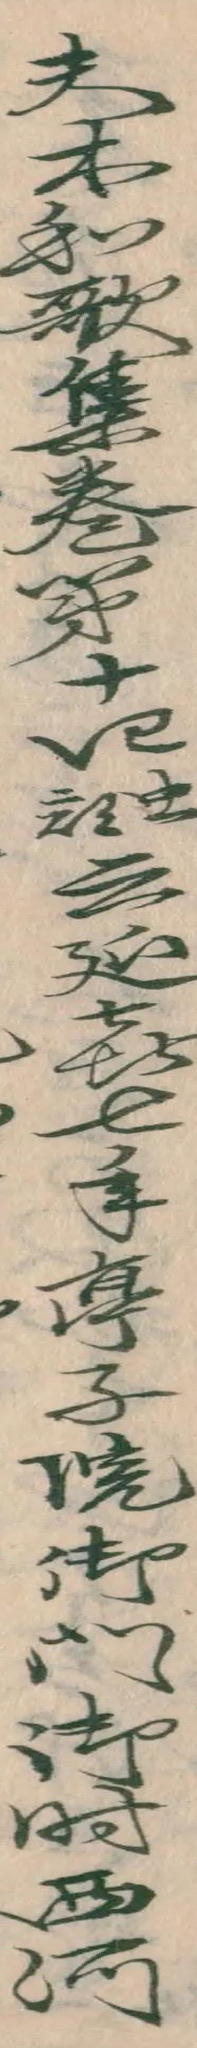夫木和歌集巻第十四虫部云延㐂七年亭子院御門御時西河
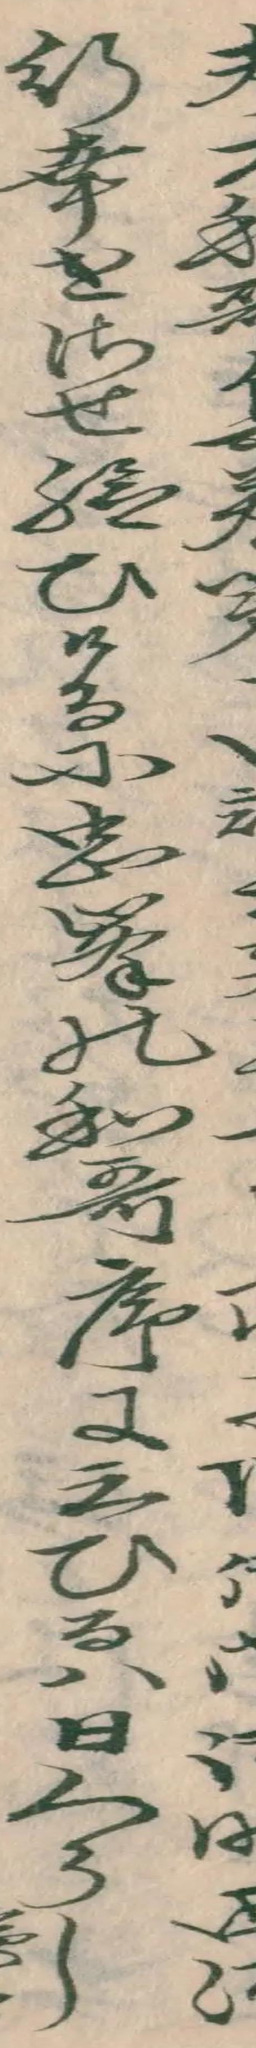行幸をさせ給ひけるに忠峯の和哥序に云ひるは日くらし
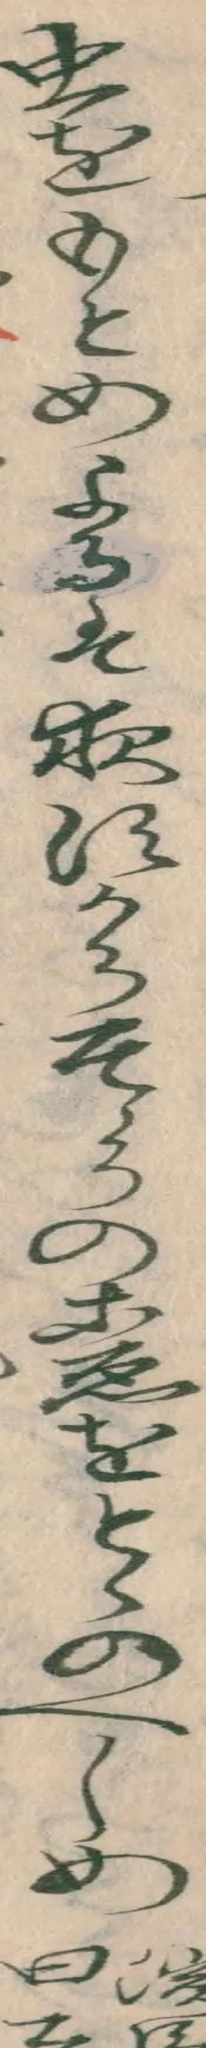虫をもとめよるは夜すからそらのこゑをとヽのへしめ濱臣曰そ
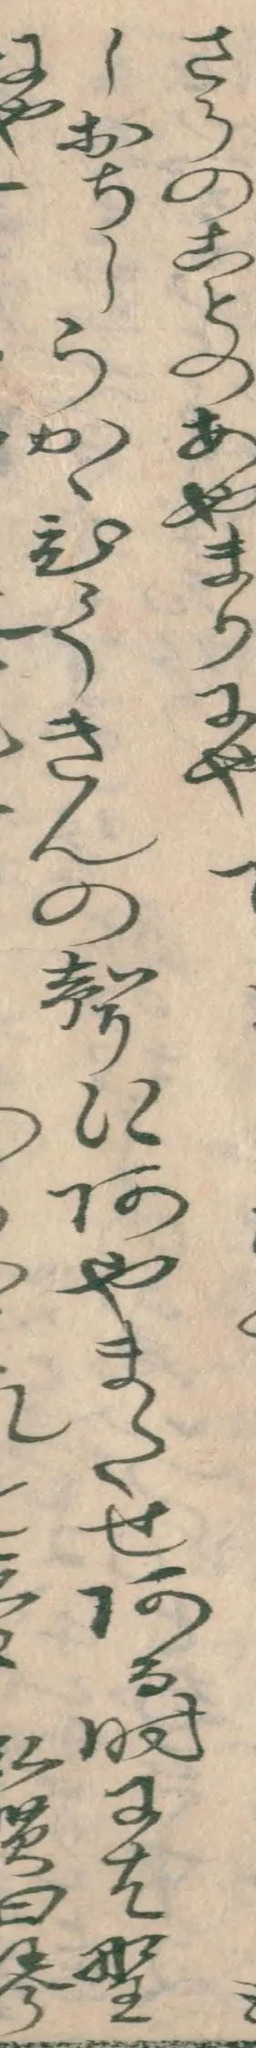しおちしにやうかゝひてきんの聲にあやまたせある時には野

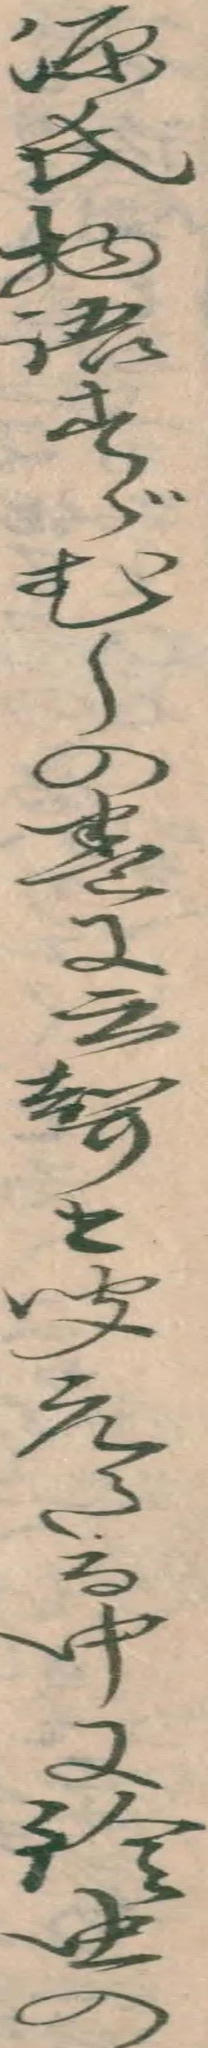源氏物語すヾむしの巻に云聲聞えたる中に鈴虫の
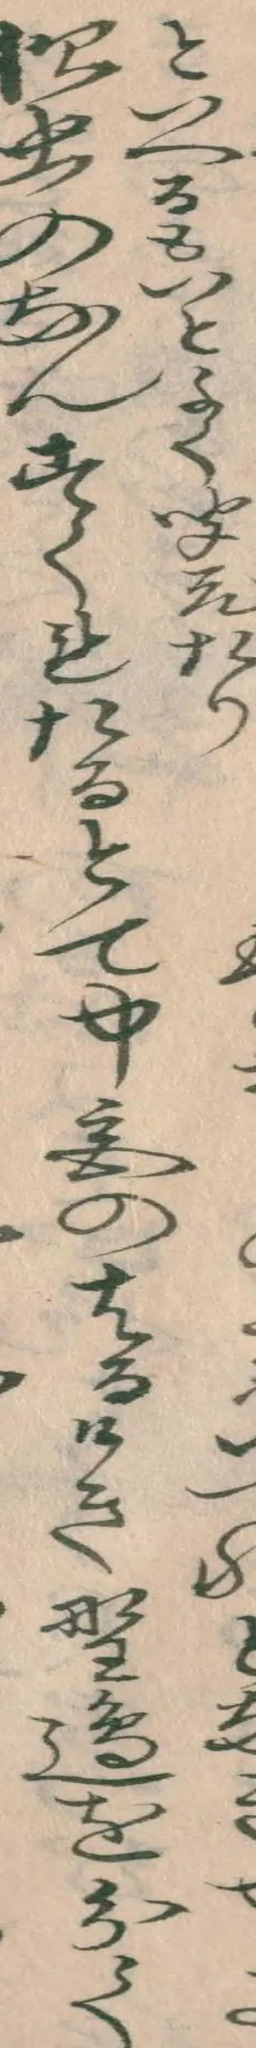松虫のなんすくれたるとて中宮のはるけき野辺を分て
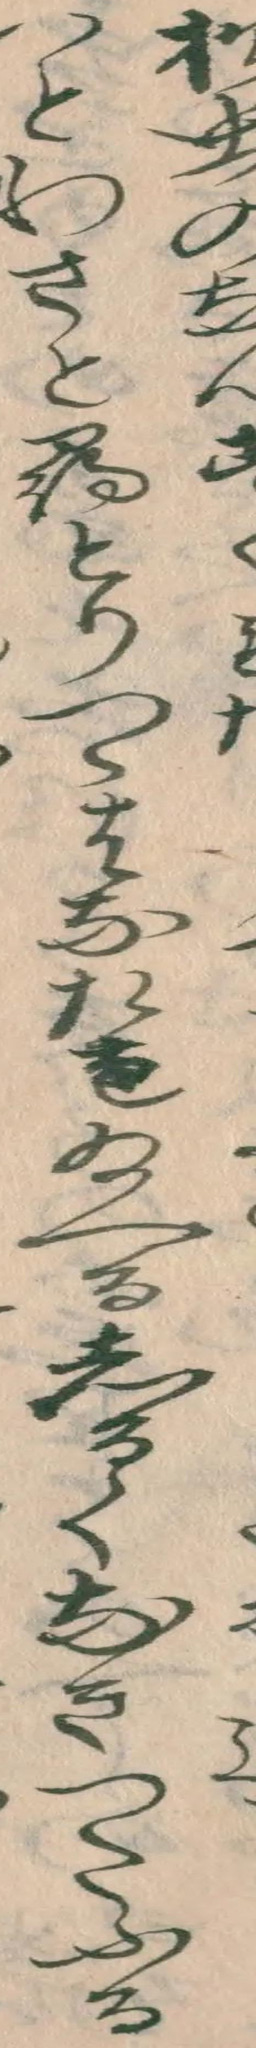いとわさと尋とりつゝはなたれ給へるしるくなきつたふる
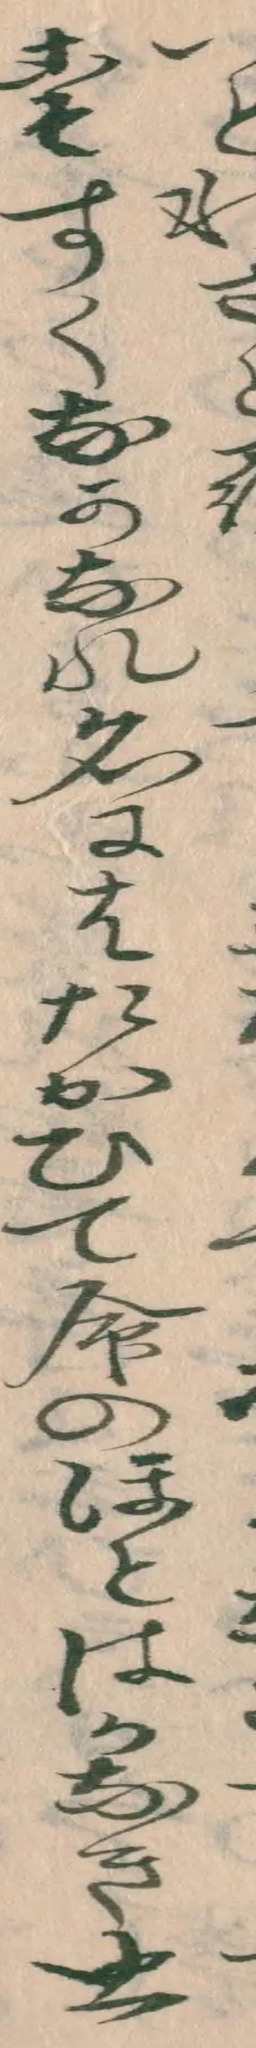こそすくなかなれ名にはたかひて命のほとはかなき虫
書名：千蟲譜 3巻. [3]
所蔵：国立国会図書館 National Diet Library, JAPAN
